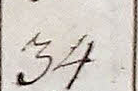34
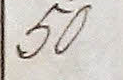50
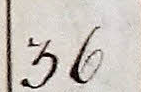36
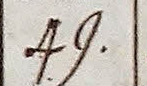49.
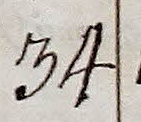34
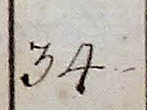34
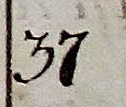37
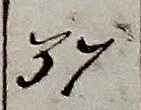37
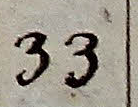33
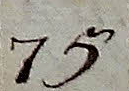75
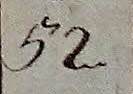52
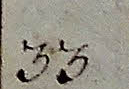33
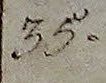35
